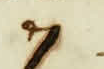7
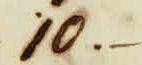10.
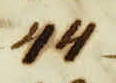44
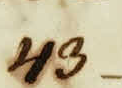43
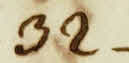32
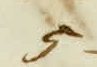5
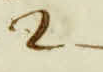2
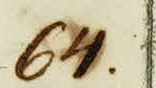64.
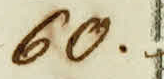60.
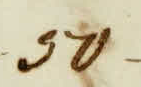50
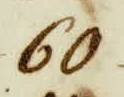60
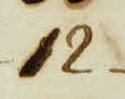12
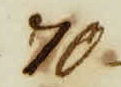70
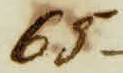65
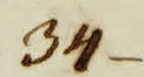34
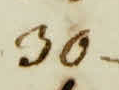30
